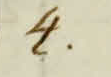4.
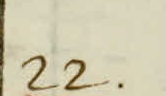22.
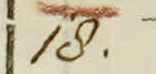18.
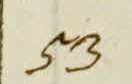53
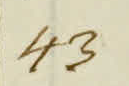43
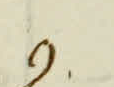9.
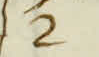2
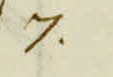7.
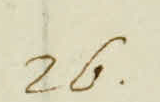26.
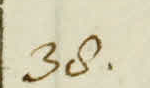38.
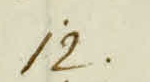12.
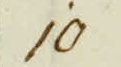10
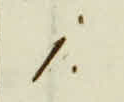1.
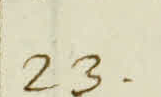23.
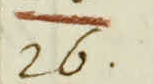26.
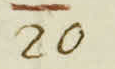20
